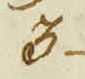3
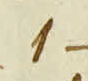1
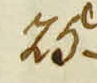25
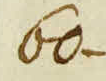60
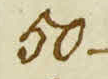50
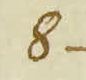8
